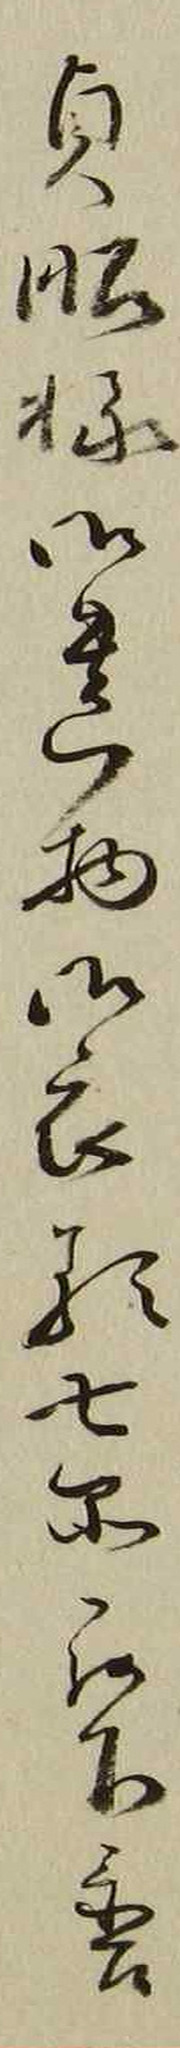貞昭様御遺物御衣類七品被下置候
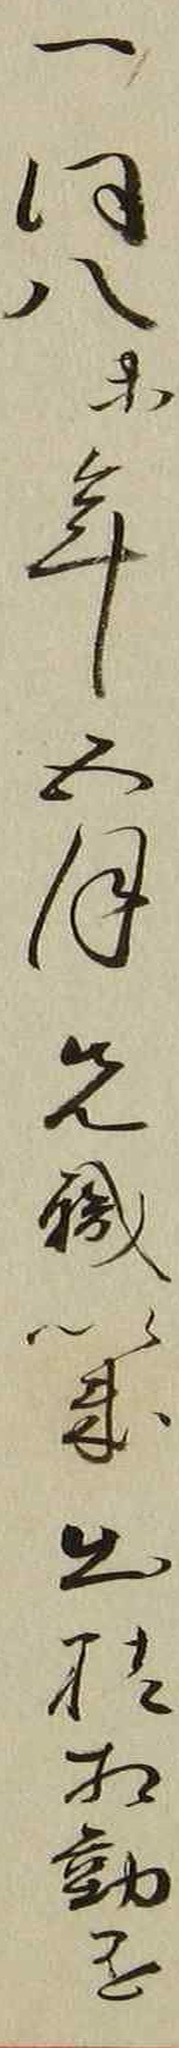一同八未年五月先職以来出精相勤懸
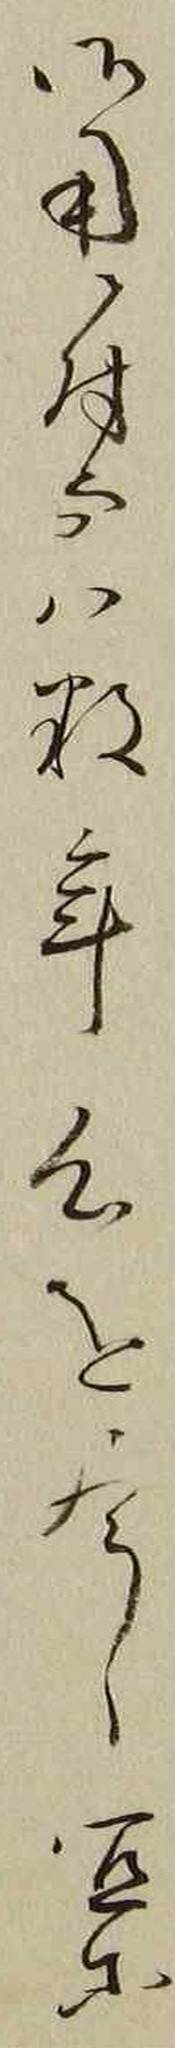御用ニ付而ハ数年心を尽し宜等
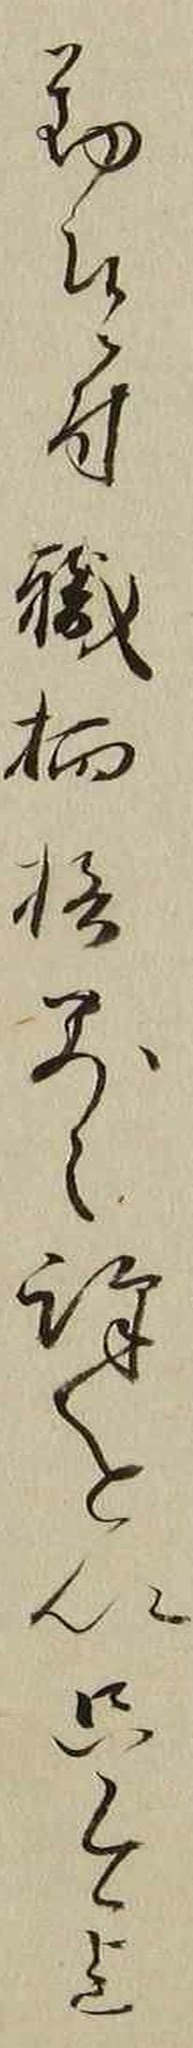勤候ニ付職柄格別之許を以只今迄
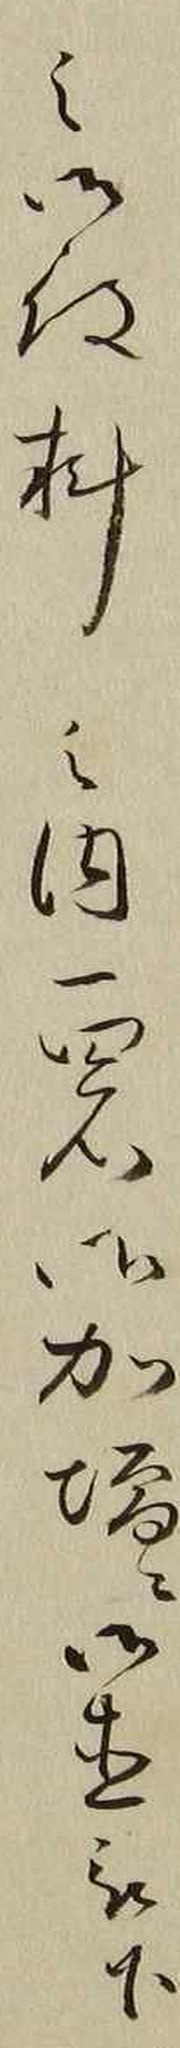之御役料之内百石御加増ニ御直被下
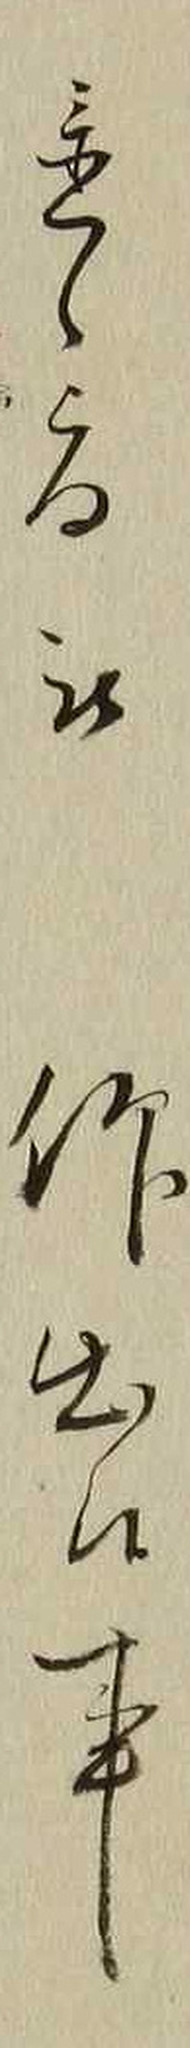置之旨被仰出候事
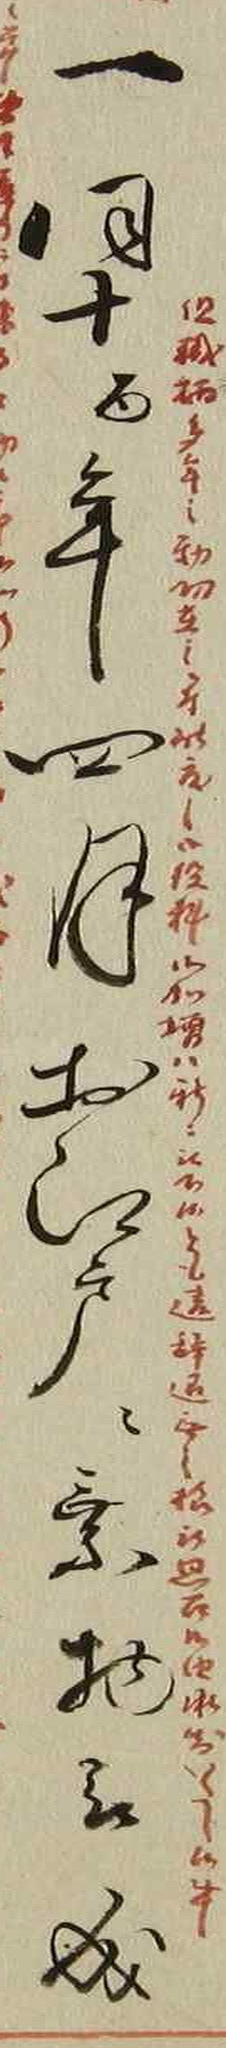一同十酉年四月於江戸ニ乗物被成
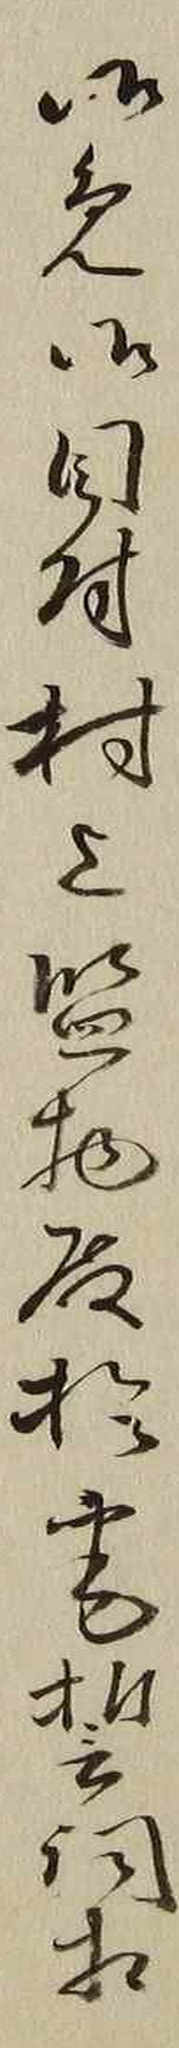御免御目付村上監物殿於宅誓詞相
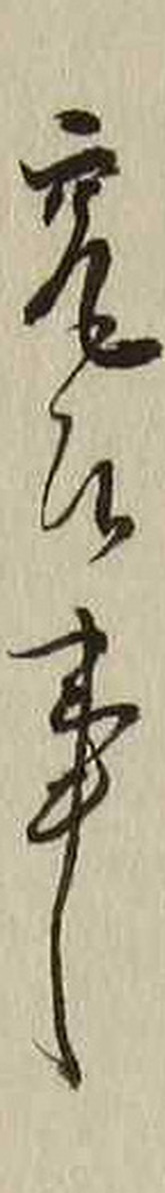究候事
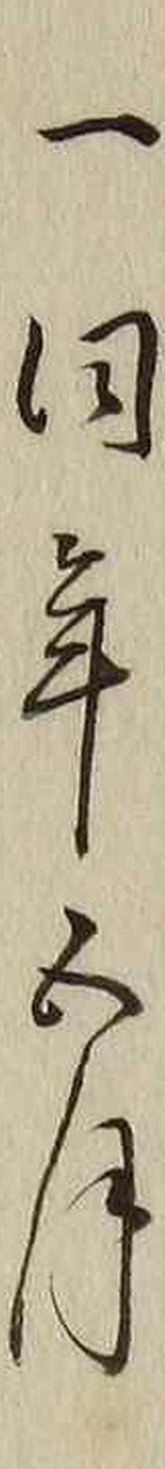一同年五月
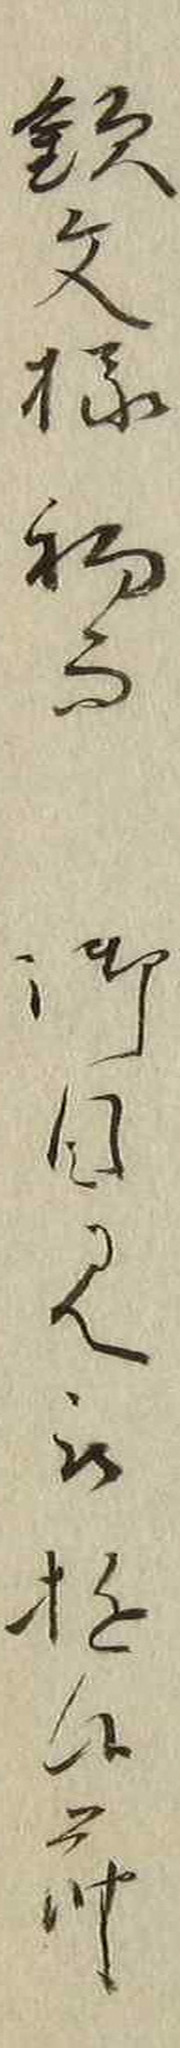欽文様初而御目見被遊候節
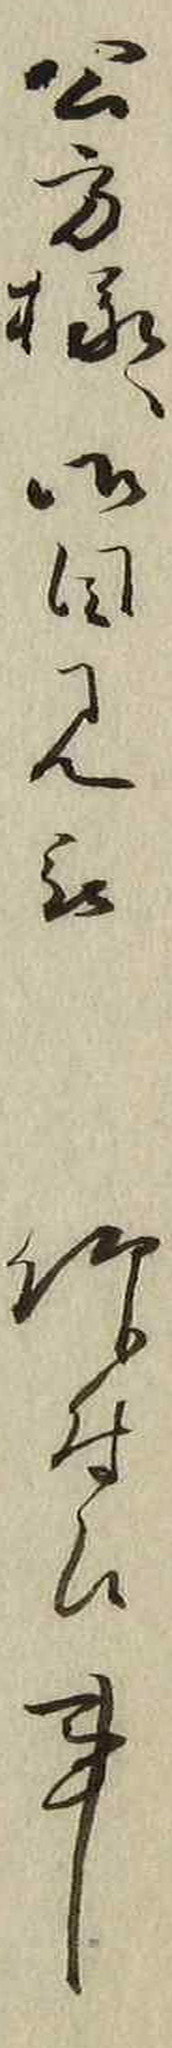公方様へ御目見被仰付候事
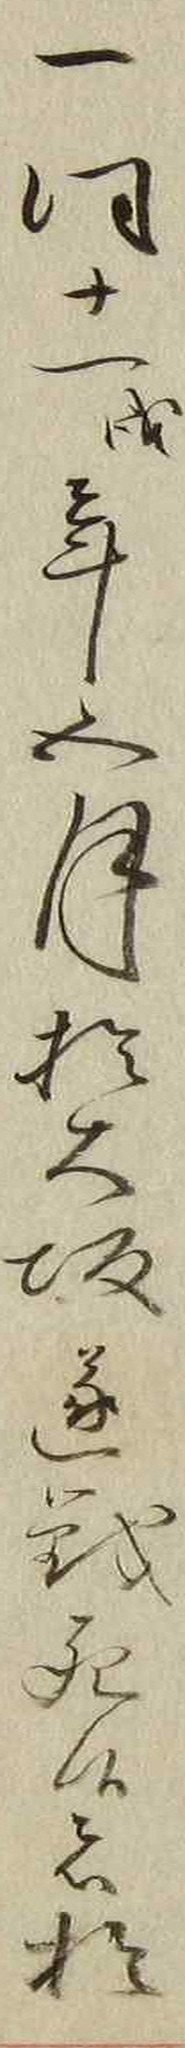一同十一戌年五月於大坂遂戦死候者於
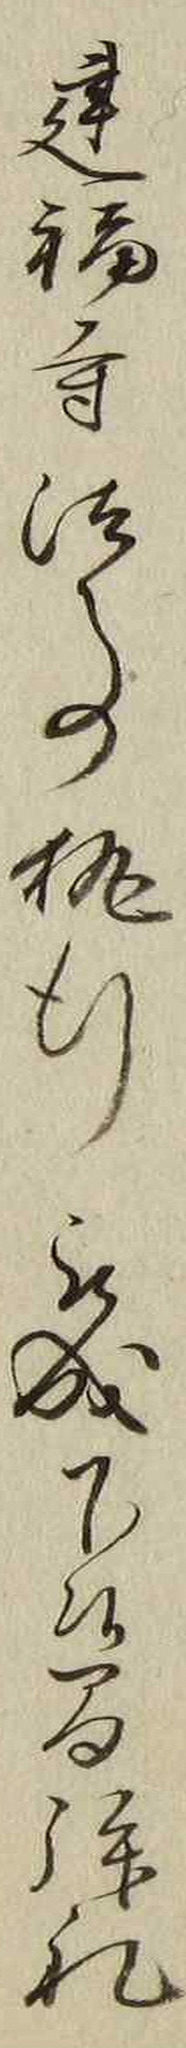建福寺法事執行被成下候間拝礼
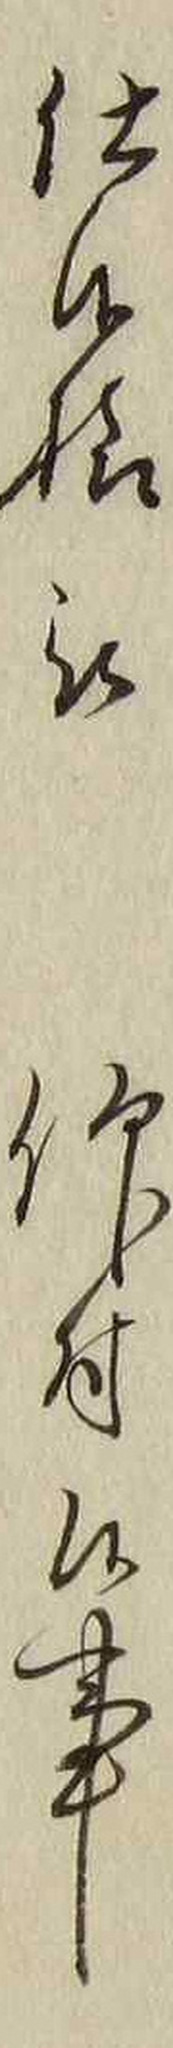仕候様被仰付候事
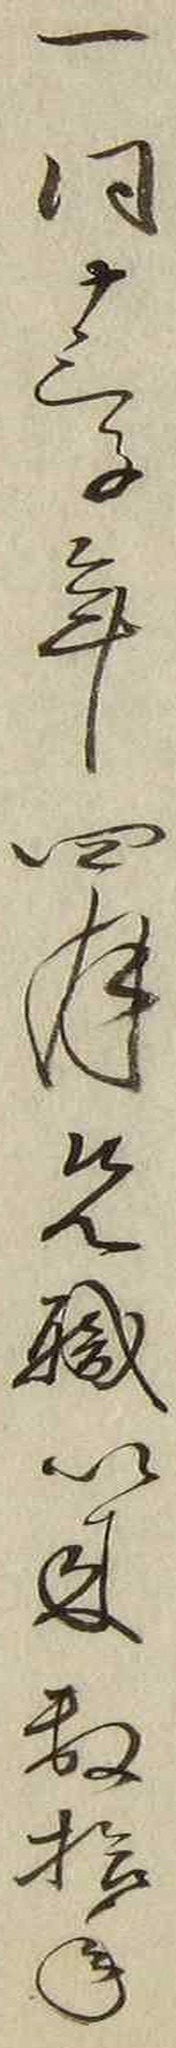一同十三子年四月先職以来数拾年
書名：諸士系譜　巻之2　い之部2
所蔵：会津若松市立会津図書館
